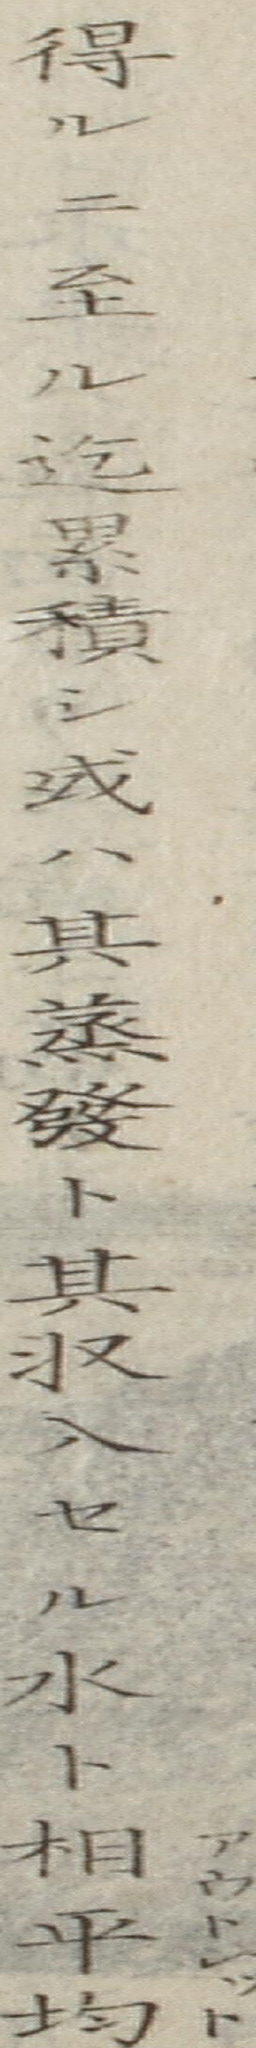得ルニ至ル迄累積シ或ハ其蒸発ト其収入セル水ト相平均
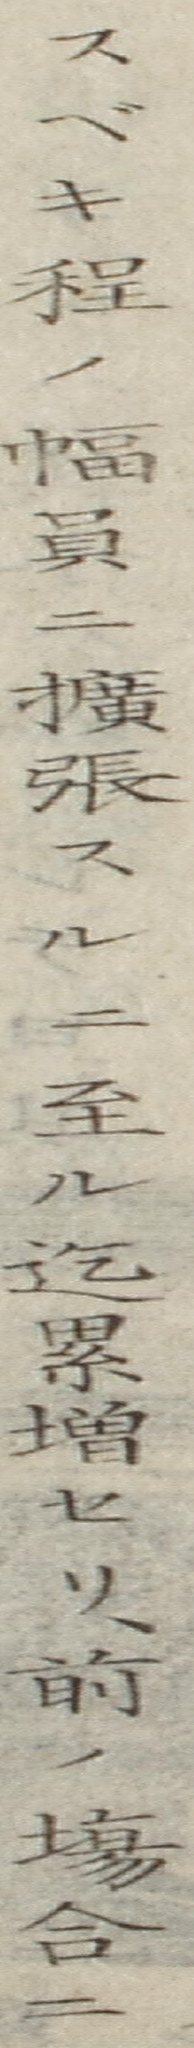スベキ程ノ幅員ニ拡張スルニ至ル迄累増セリ、前ノ場合ニ
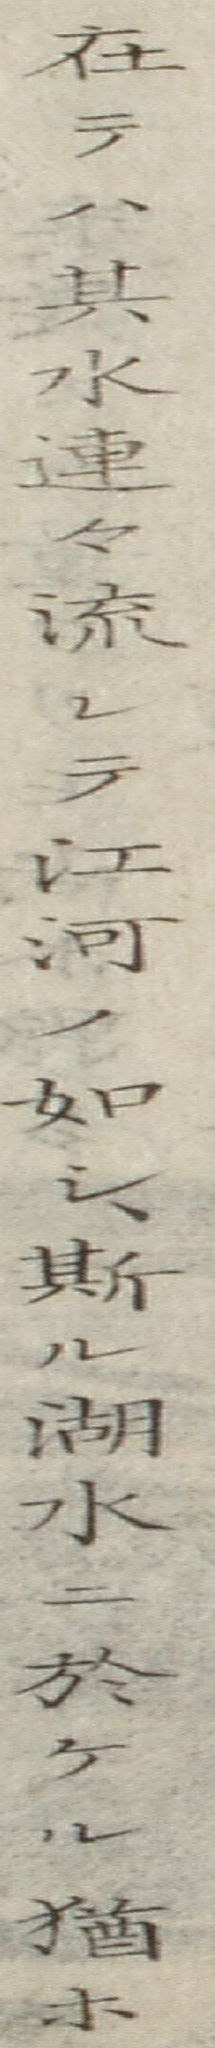在テハ其推連々流レテ江河ノ如シ、斯ル湖水ニ於ケル猶ホ
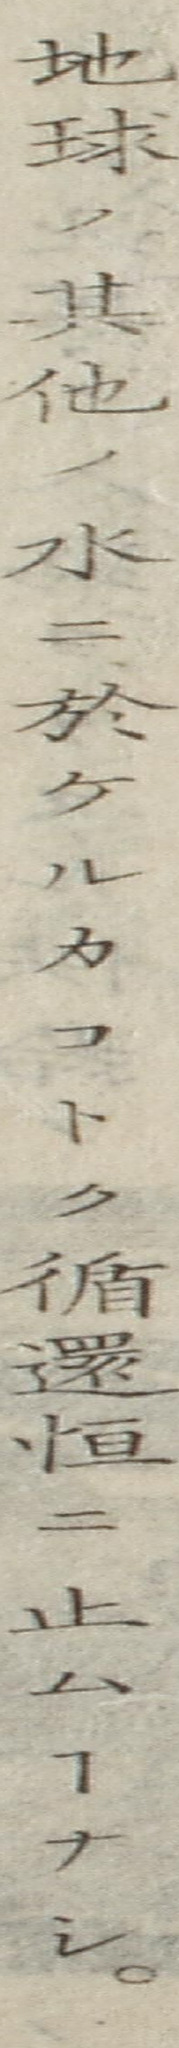地球ノ其他ノ水ニ於ケルカコトク循還恒ニ止ムヿナシ。
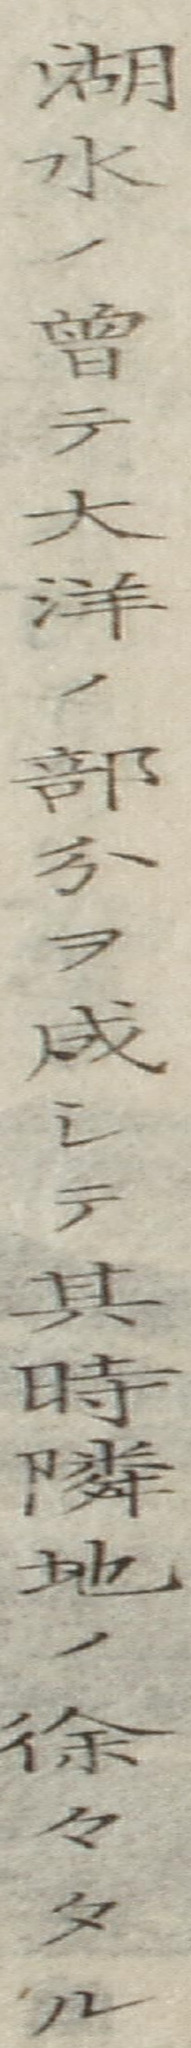湖水ノ曽テ大洋ノ部分ヲ成シテ其時隣地ノ徐々タル
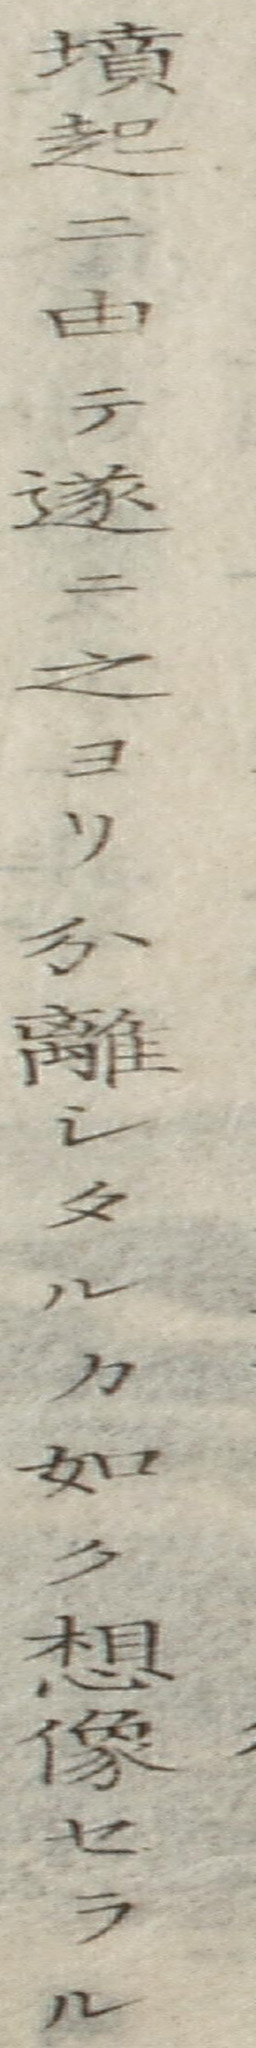墳起ニ由テ遂ニ之ヨリ分離シタルカ如ク想像セラル
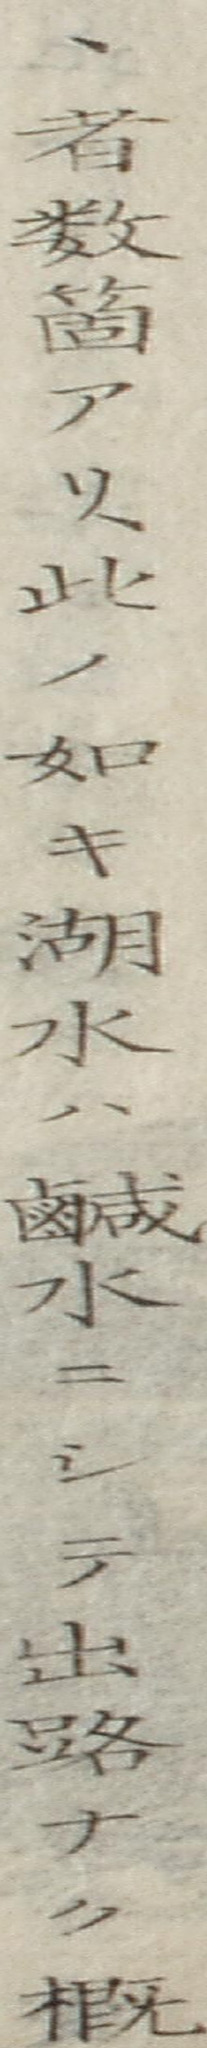ヽ者数箇アリ、此ノ如キ湖水ハ鹹水ニシテ出路ナク概
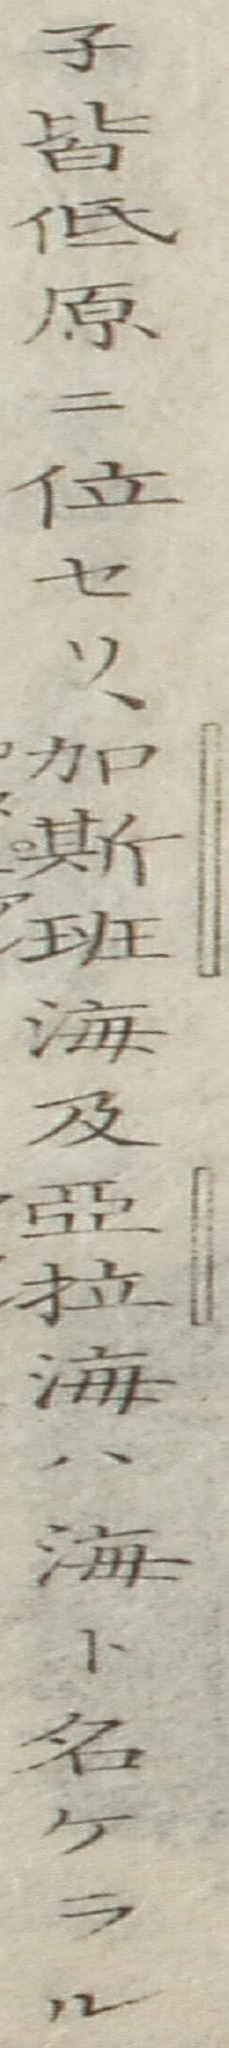ね皆低原ニ位セリ、加斯班海及亜拉海ハ海ト名ケラル
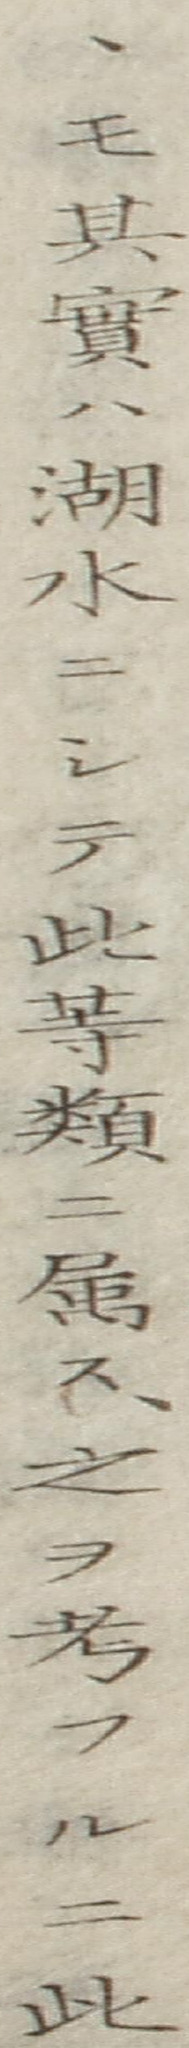ヽモ其実ハ湖水ニシテ此等類ニ属ス、之ヲ考フルニ此
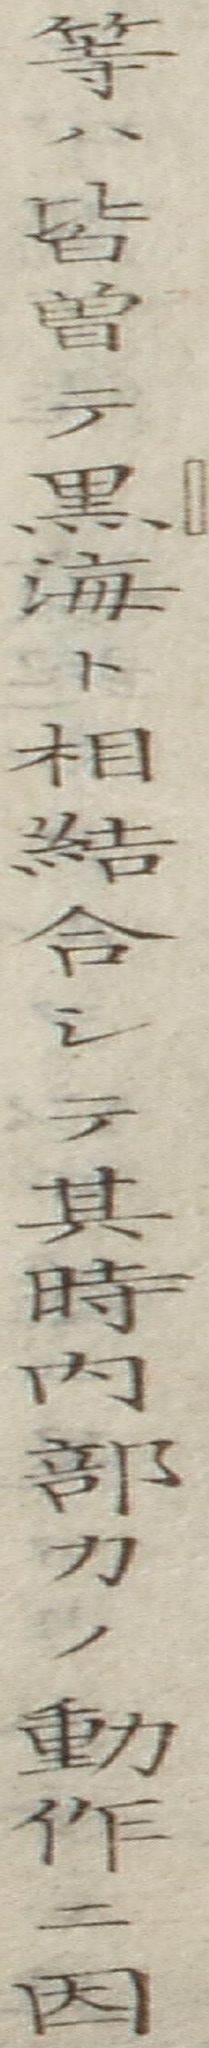等ハ皆曽テ黒海ト相結合シテ其時内部力ノ動作ニ因

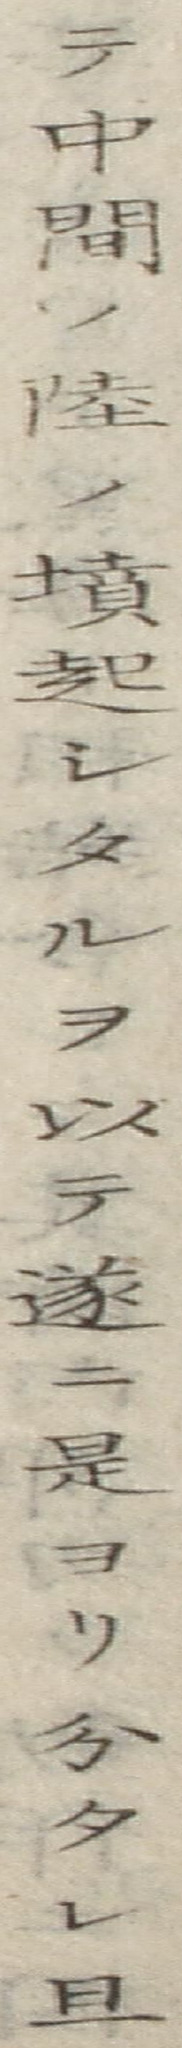テ中間ノ陸ノ墳起シタルヲ以テ遂ニ是ヨリ分タレ且
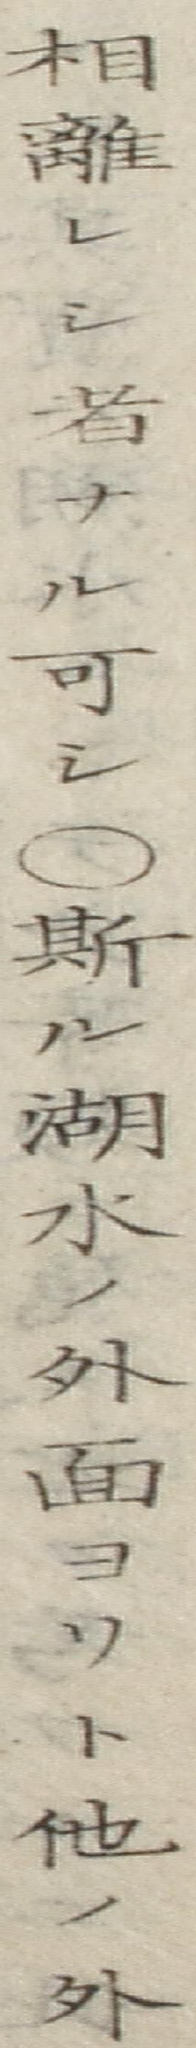相離レシ者ナル可シ○斯ル湖水ノ外面ヨリト他ノ外
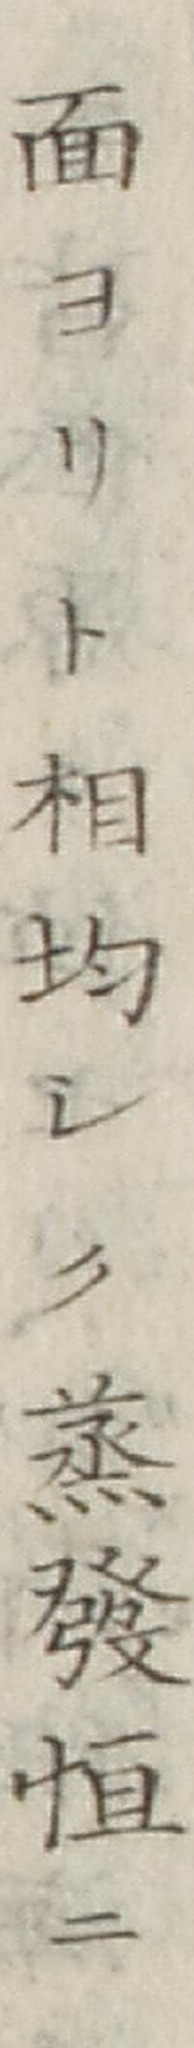面ヨリト相均シク蒸発恒ニ
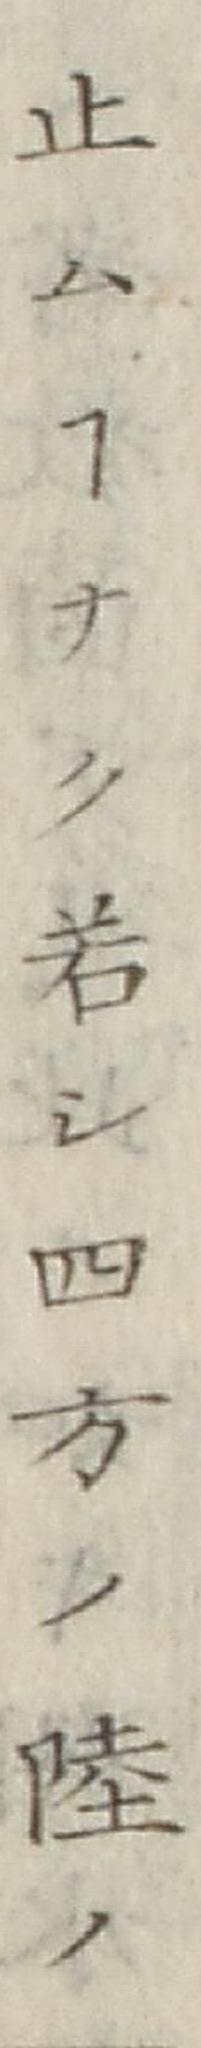止ムヿナク若シ四方ノ陸ノ
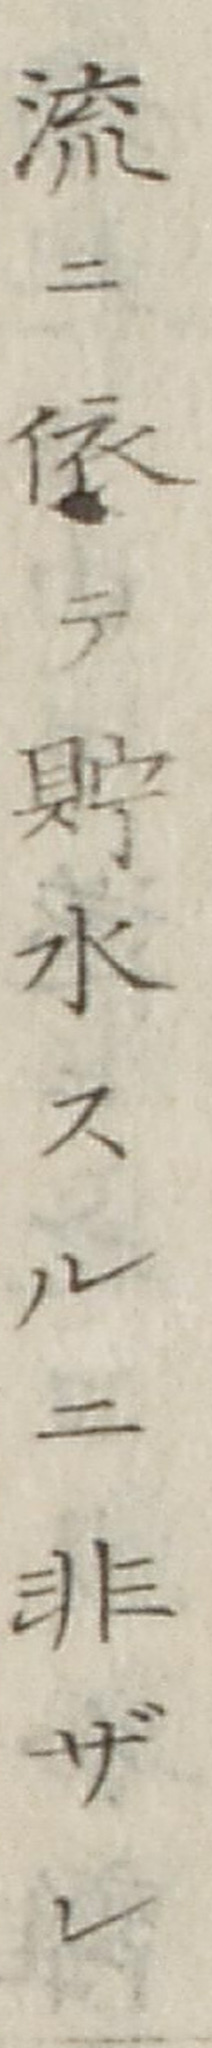流ニ依テ貯水スルニ非ザレ
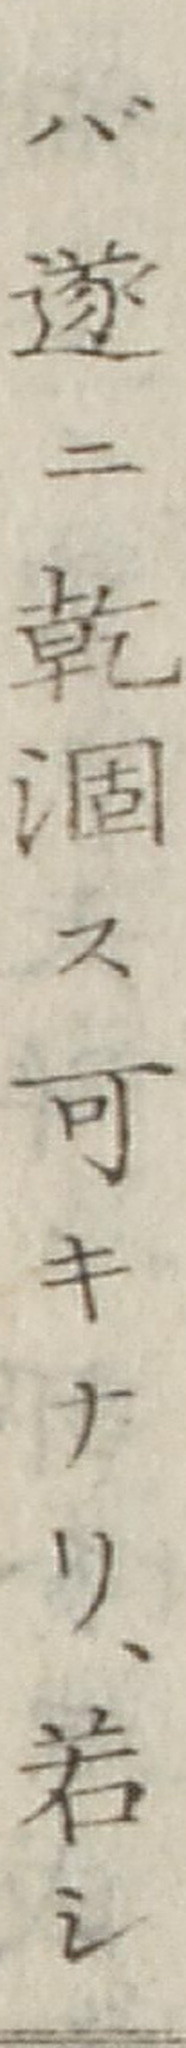バ遂ニ乾涸ス可キナリ、若シ
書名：地形論　巻二
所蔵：東京大学地震研究所図書室 Earthquake Research Institute Library, The University of Tokyo, JAPAN
